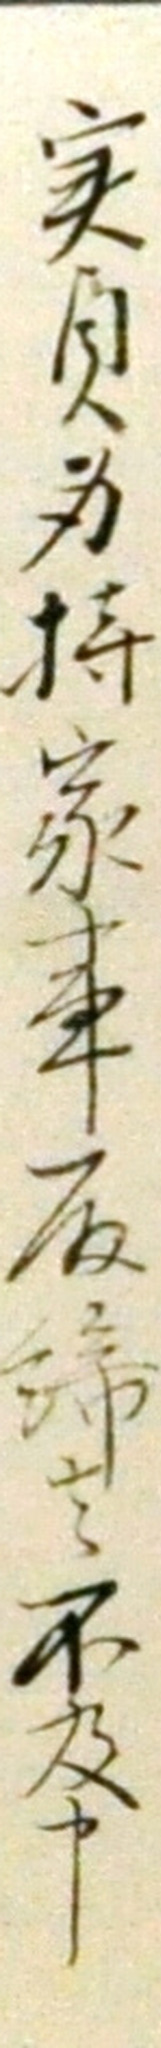実貞身持家事取締は不及申
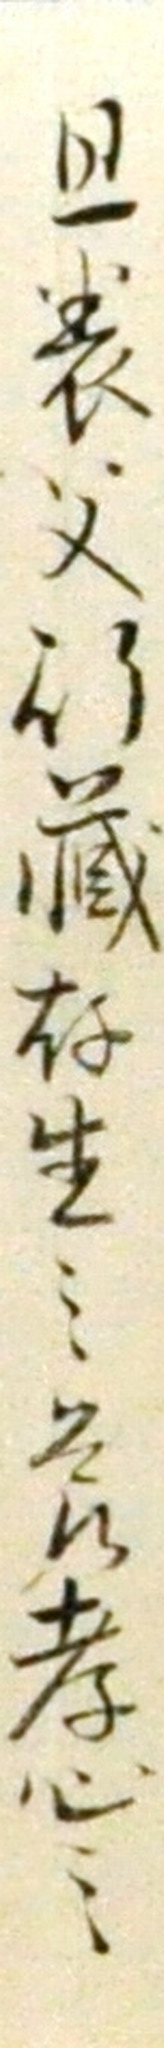且養父行蔵存生之節孝心之
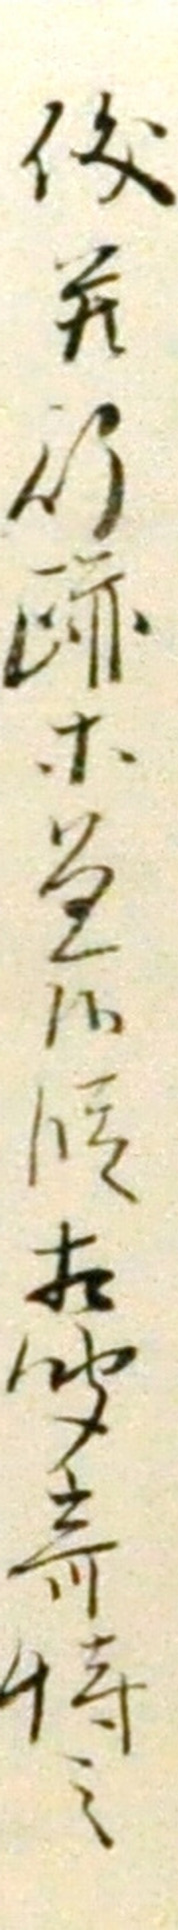儀并行跡等兼候段相聞奇特之
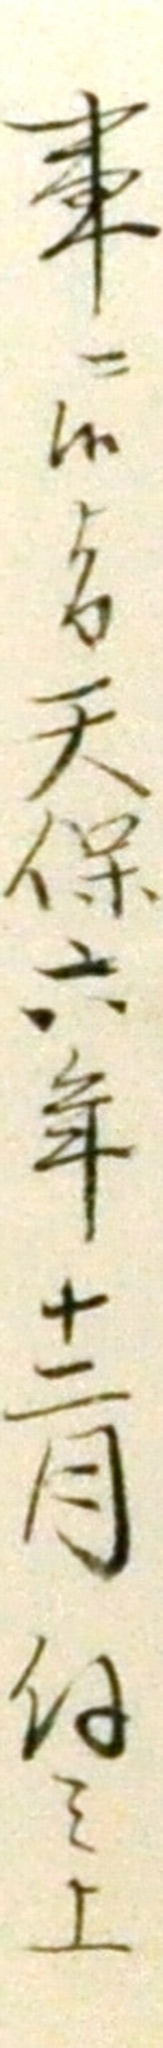事ニ候旨天保六年十二月伺之上
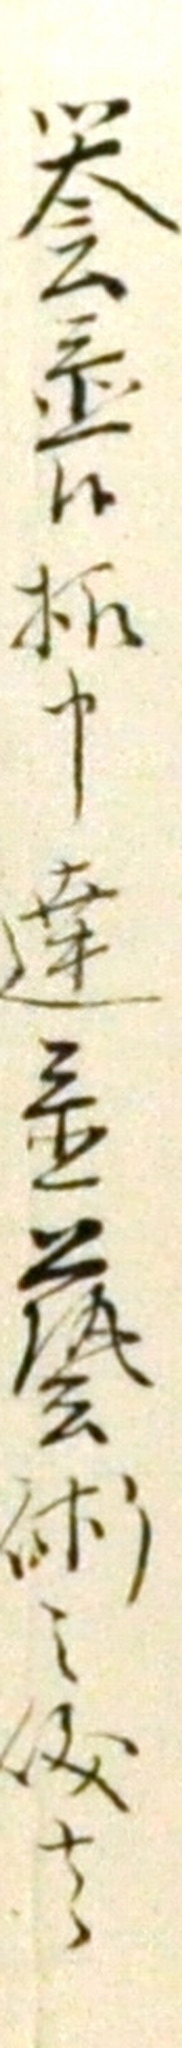誉置候様申達置芸術之儀者
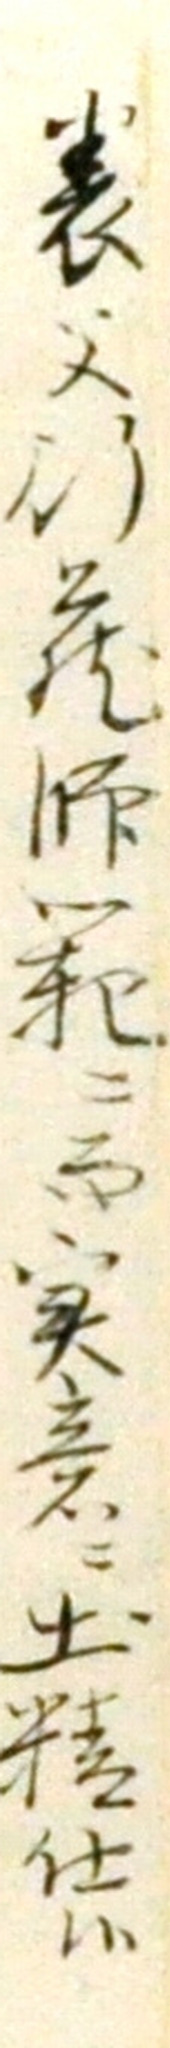養父行蔵師範ニ而実意に出精仕候
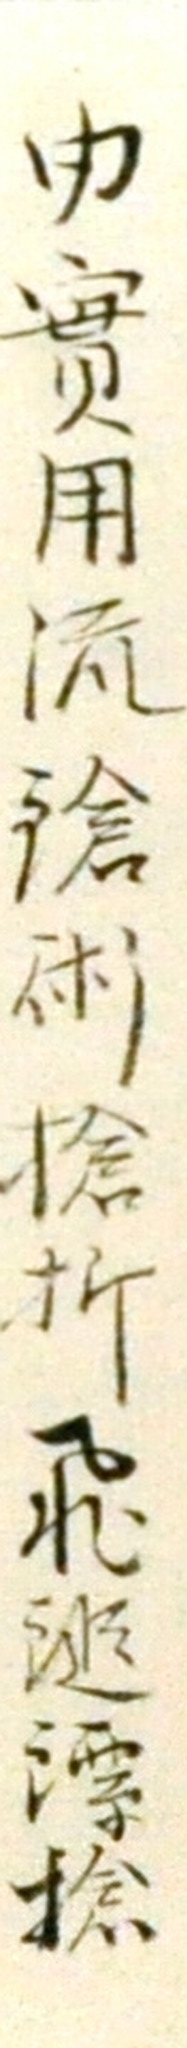由実用流鎗術槍折飛鎚鏢槍
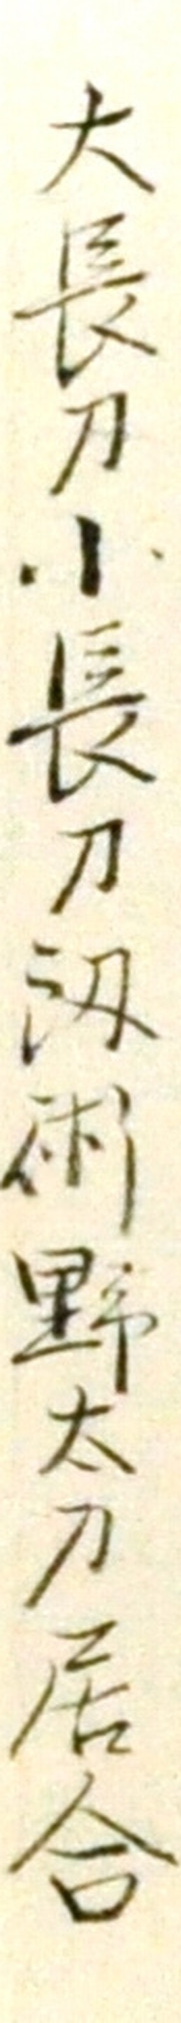大長刀小長刀剣術野太刀居合
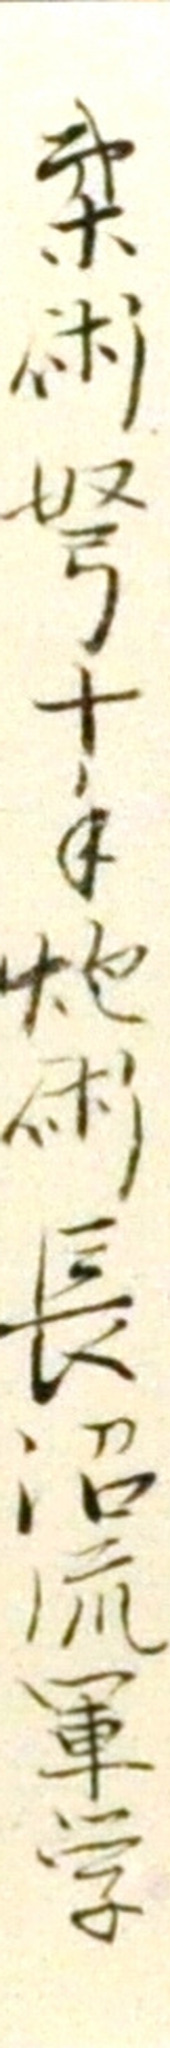柔術弩十手砲術長沼流軍学
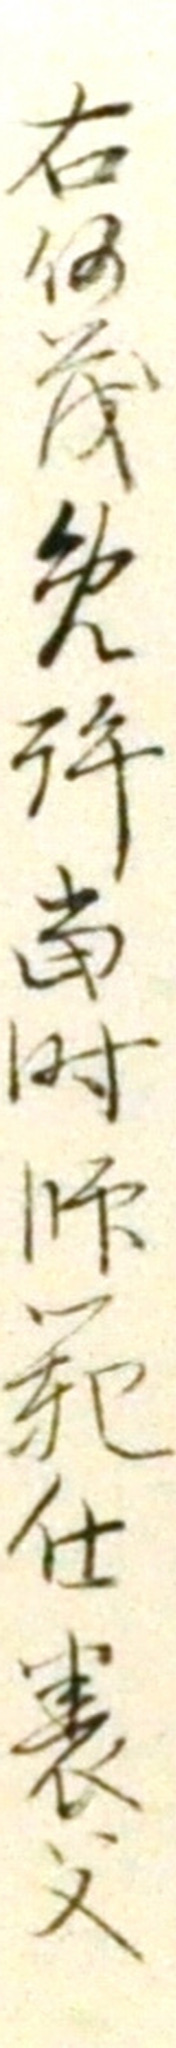右何茂免許当時師範仕養父
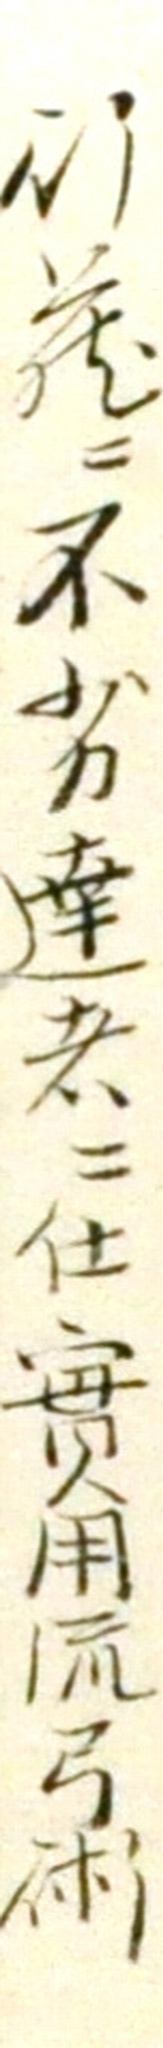行蔵ニ不劣達者ニ仕実用流弓術
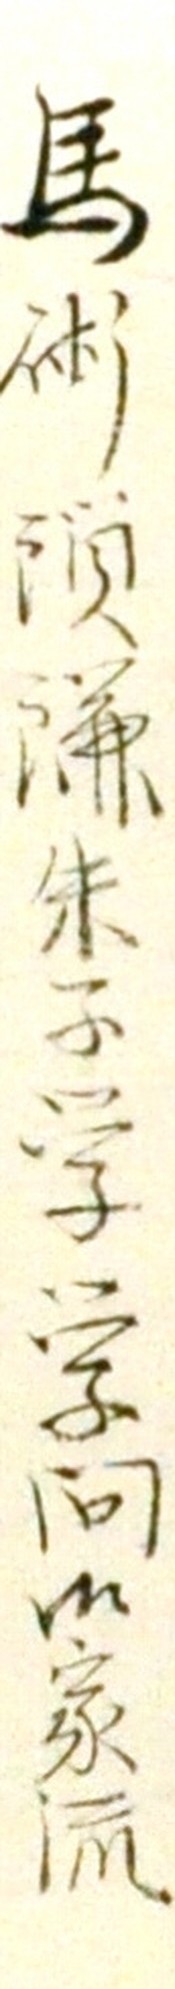馬術鎖鎌朱子学学問御家流
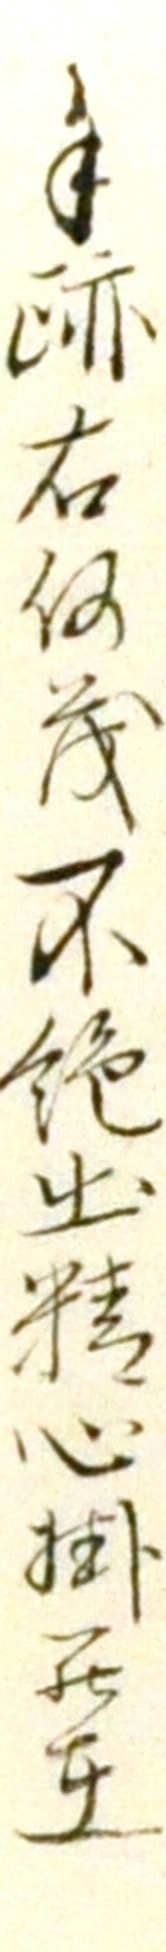手跡右何茂不絶出精心掛罷在
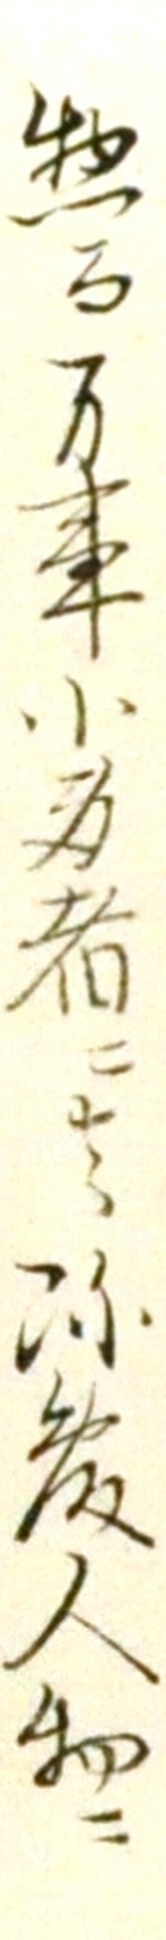惣而万事小身者ニ者珍敷人物ニ
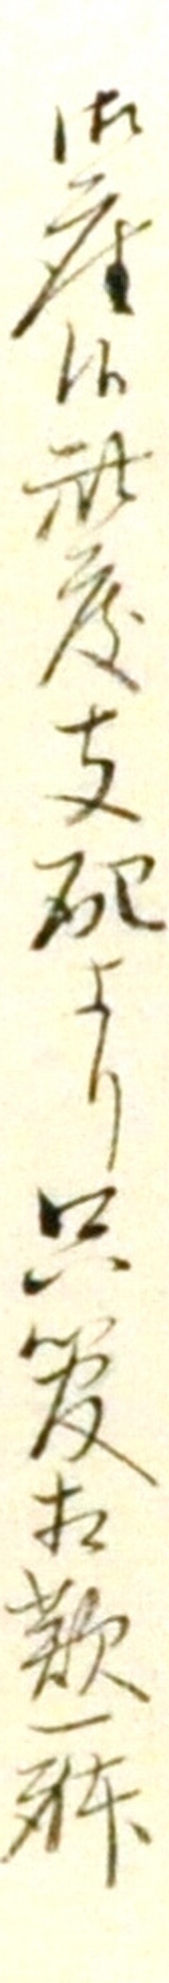御座候此度支配より只管相歎一体
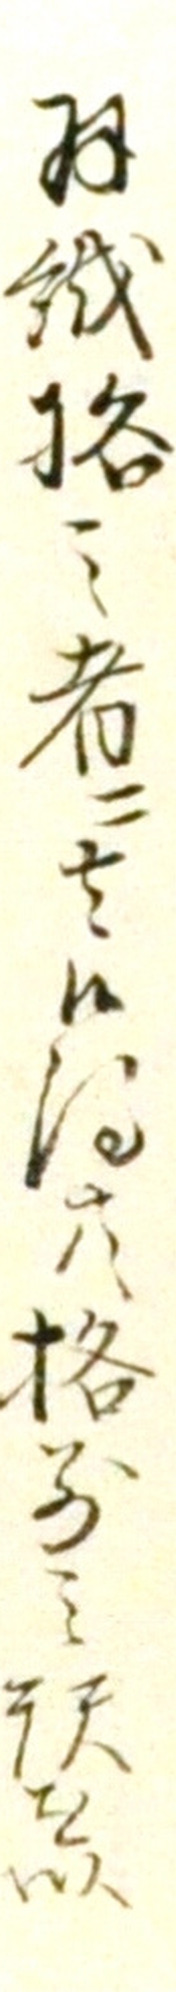羽織格之者ニ者候得共格別之訳を以
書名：西丸表火之番調
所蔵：伊那市立高遠町図書館・合同会社AMANE
